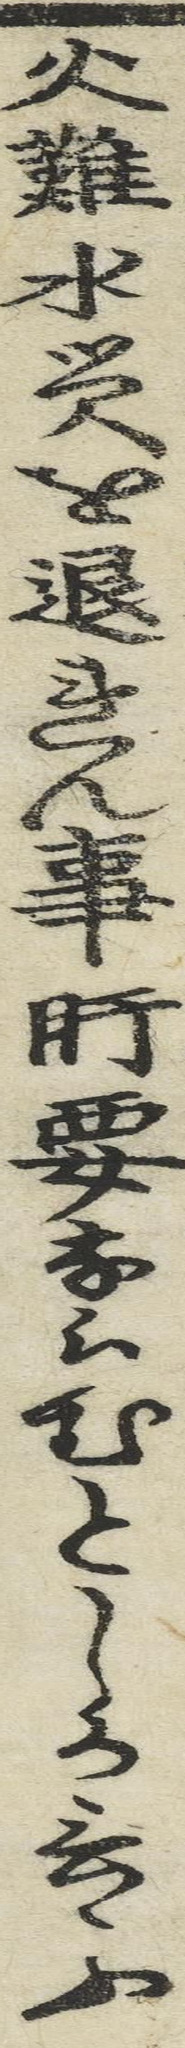火難水災を退れん事肝要ならむとしか云ふ
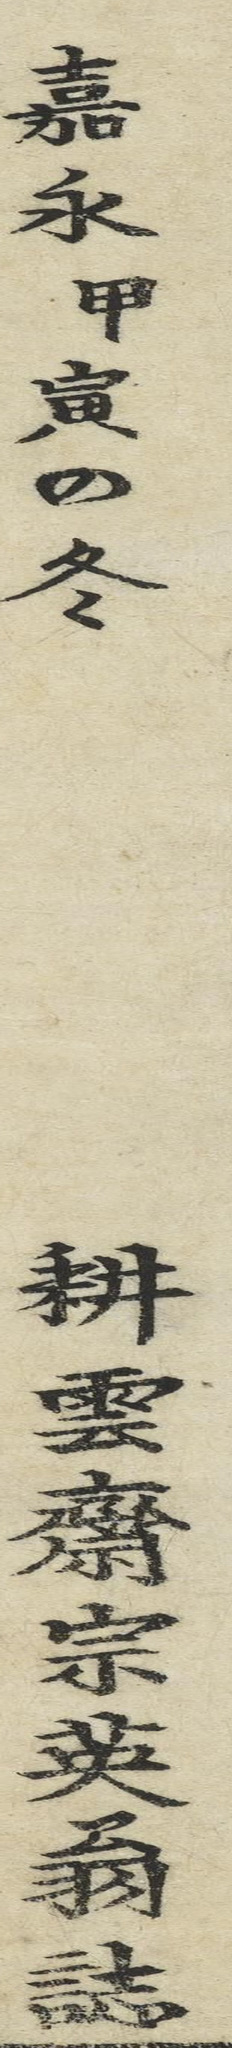嘉永甲寅の冬耕雲齋宗英翁誌
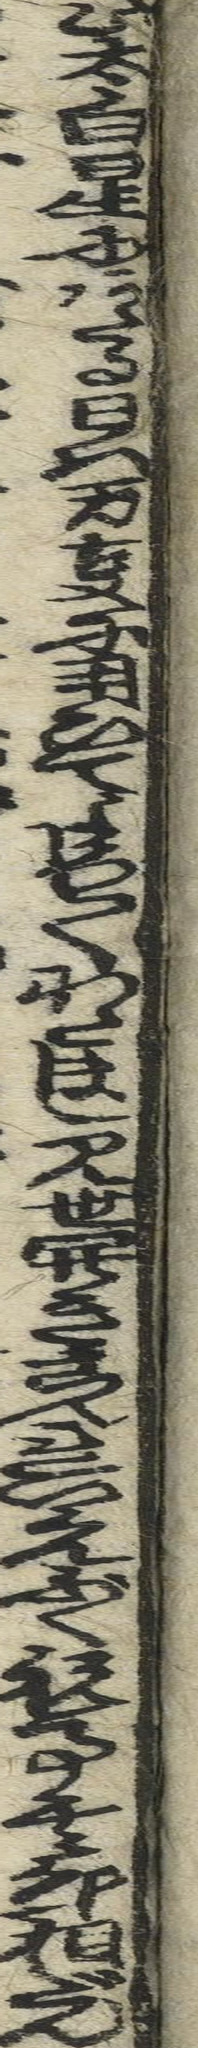〇此太白星にあたる日は万事に用ひてよろしくわたまし見世開きこんれい元ふく祝事其外相だん
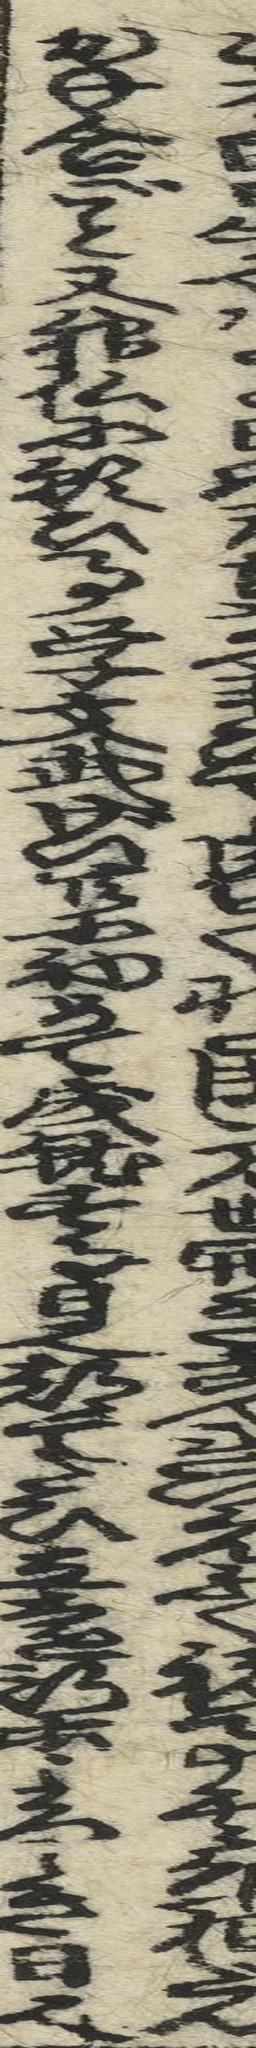かけ合ごと又神仏に願ひ事学文武げい共に初めて成就する日也都てたひ立遠行等よろしき日也
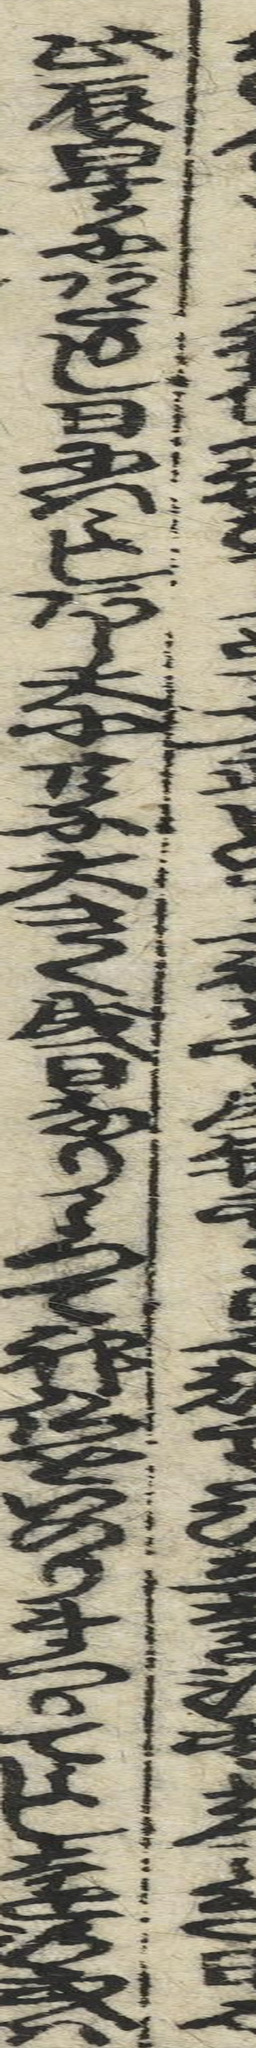〇此辰星にあたりし日にはよしあし大小共に大きく成日なりよつて神仏をいのりまつりてよし遠行或は
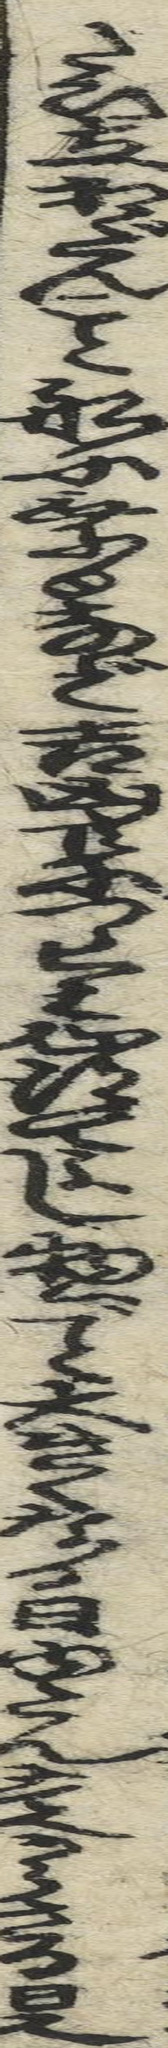たひ立相だんこと舩に乗るなど吉凶共につゝしみ心得てよし物ごと大きくなる日ゆたんすへからさる日也
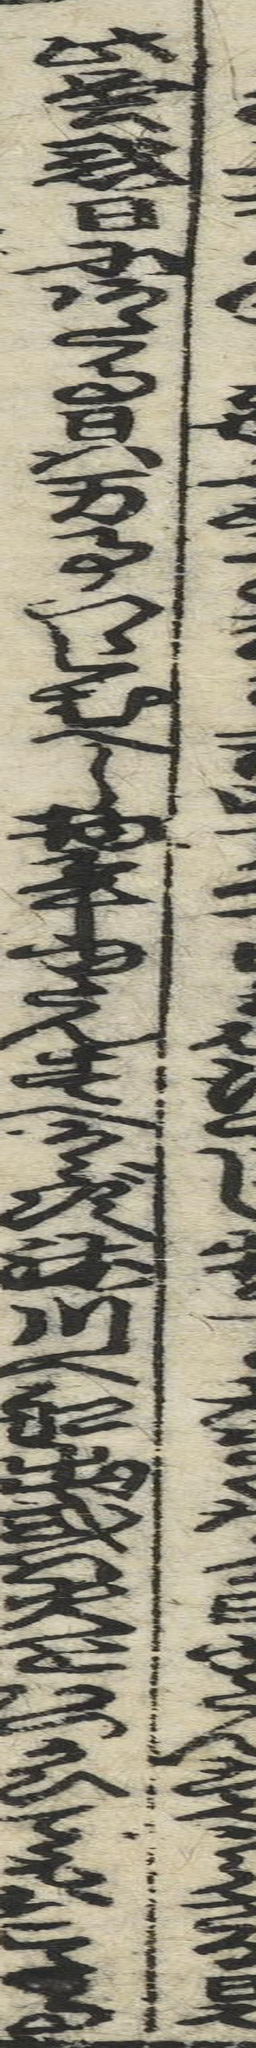●此熒惑日にあたる日は万事つゝしむへし物事ゆたんすへからず沐川へ舩出或は火をあつかひてもおこたる
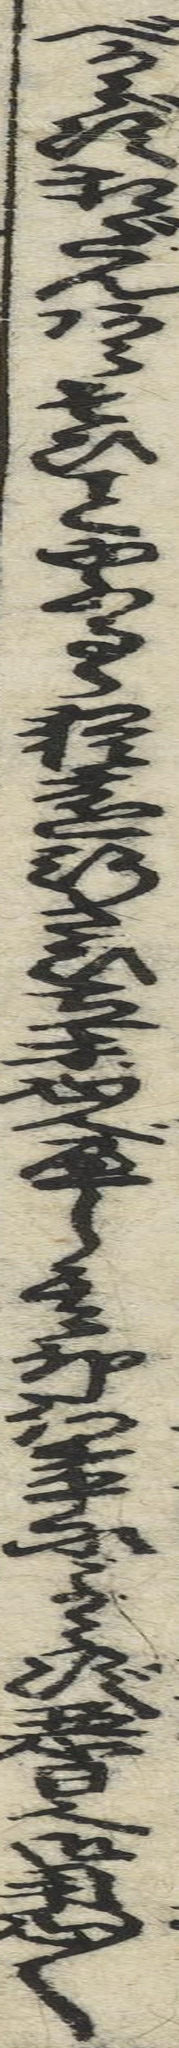べからず相だんあらそひことゆふ事〻猶遠行たひ立等心へへし其外何事によらず悪日也御用心〳〵
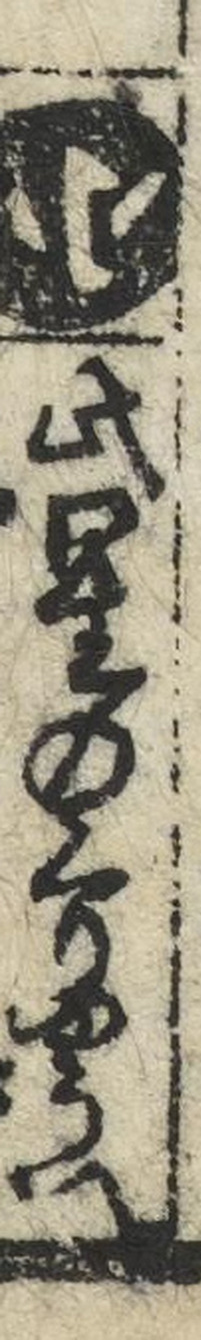此星のくりやうは
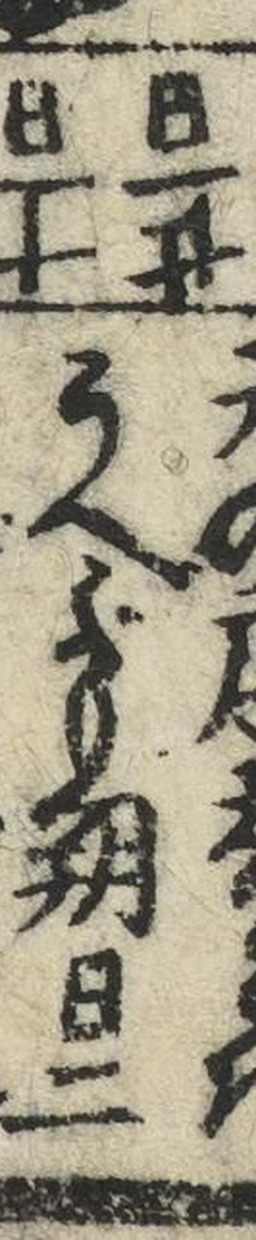うへより朔日二
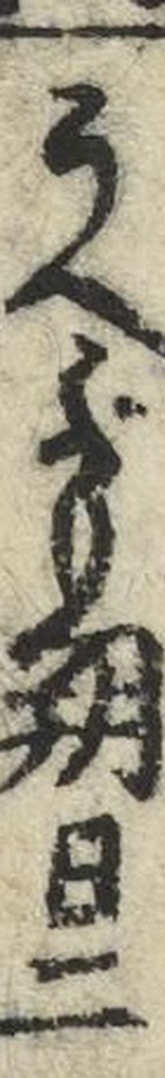うへより朔日二
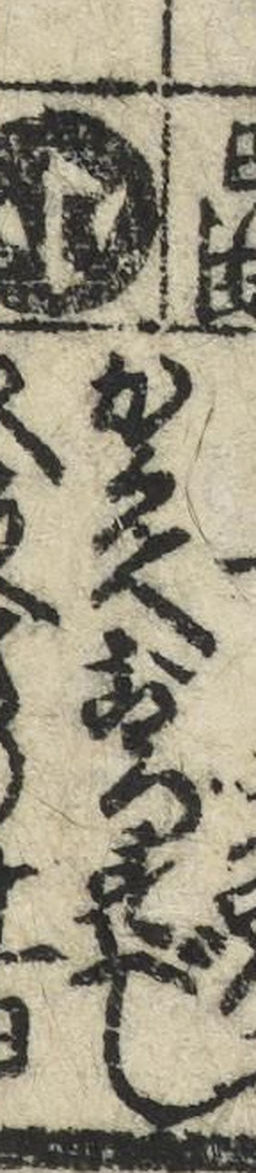かそ？へおろすべし
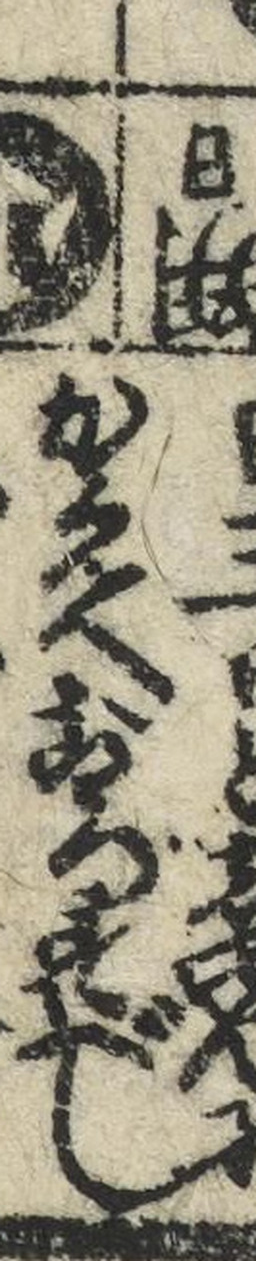かそ？へおろすべし
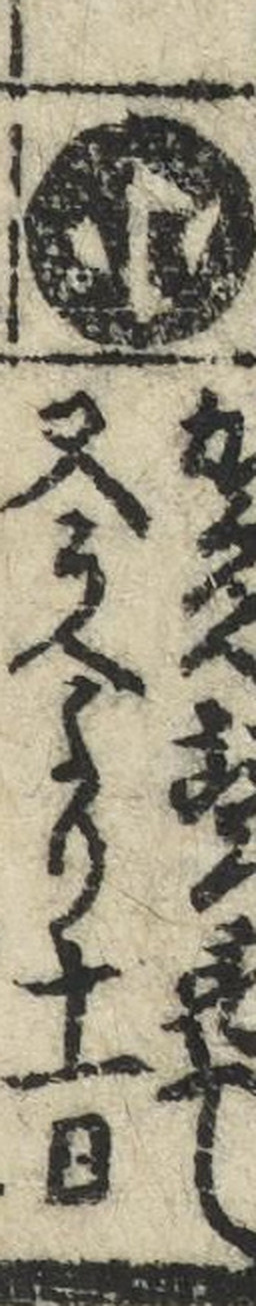又うへより十一日
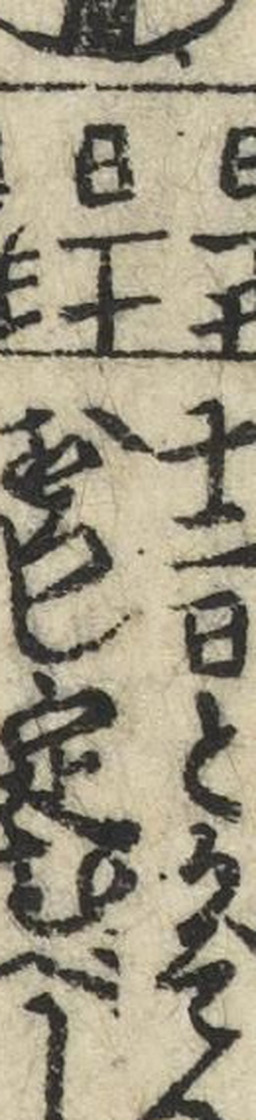おろし定むべし
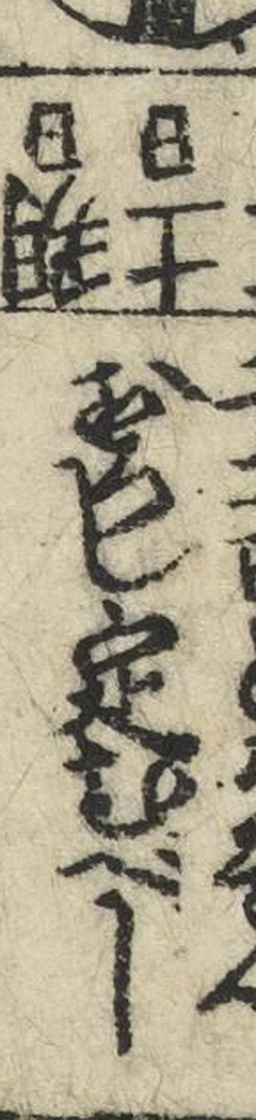おろし定むべし
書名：非常日用記
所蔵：東京大学地震研究所図書室 Earthquake Research Institute Library, The University of Tokyo, JAPAN
